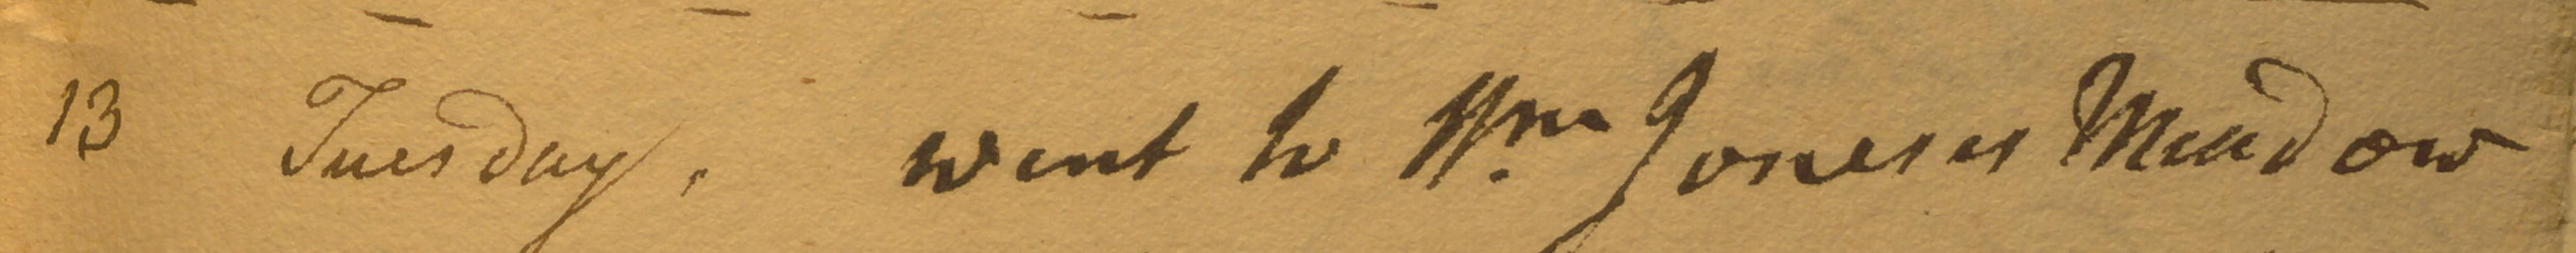13 Tuesday. went to W^m. Joneses Meadow
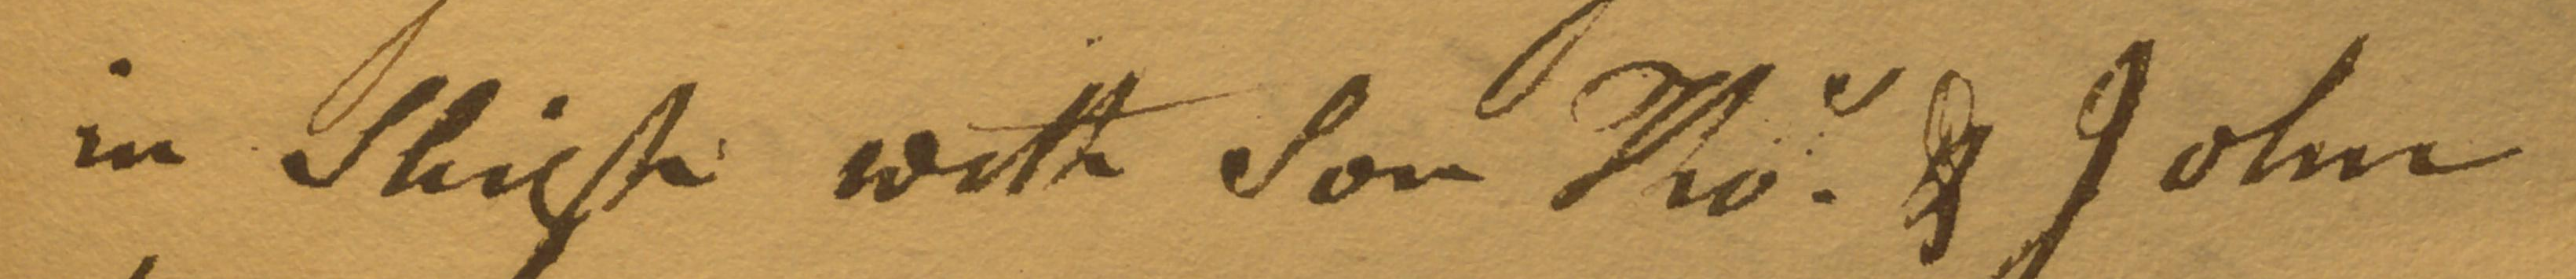in Sleigh with Son Tho^s. & John
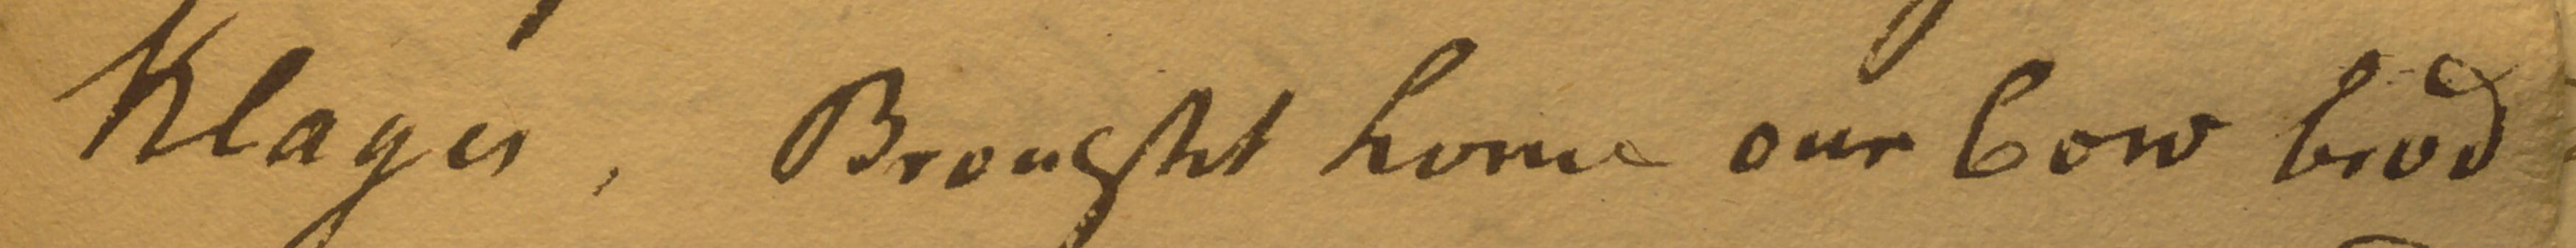Klages, Brought home our Cow brod
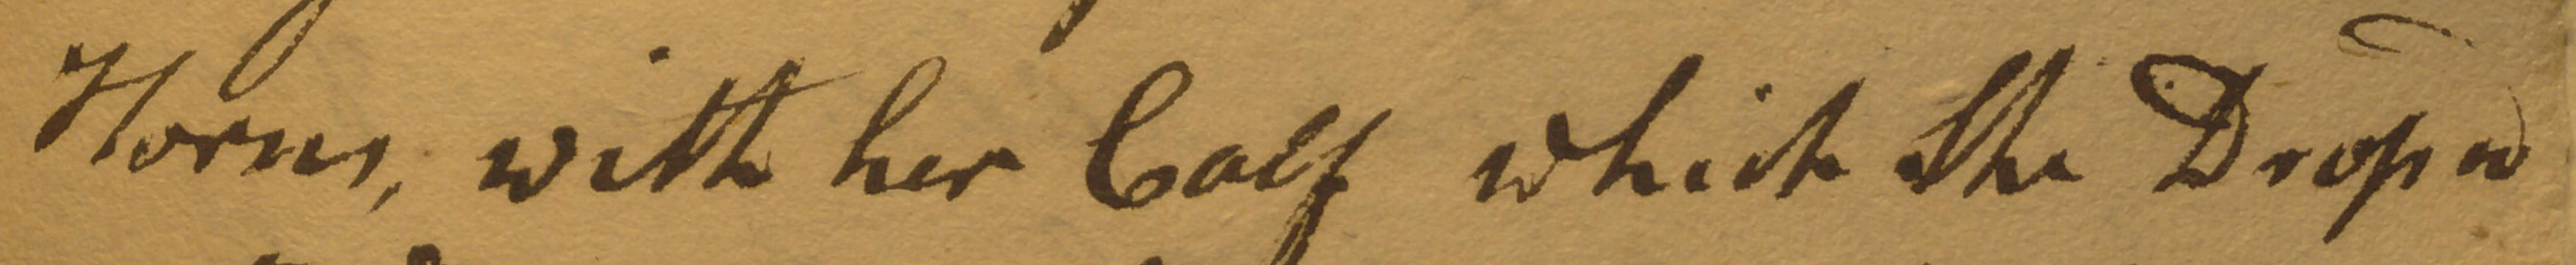Horns, with her Calf which she Droped
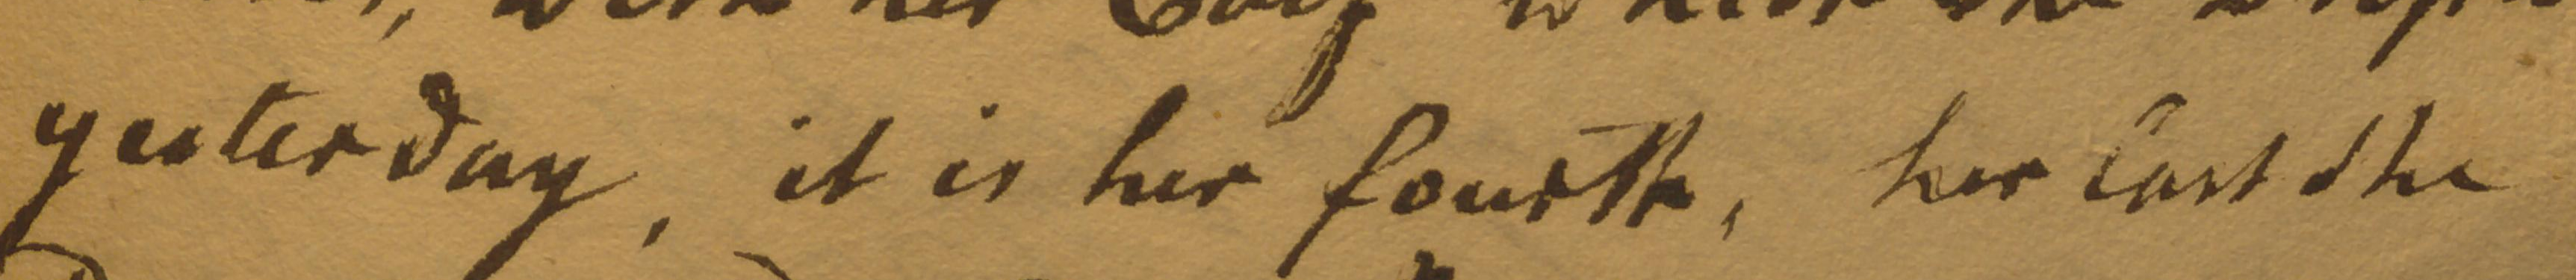yesterday it is her fourth, her last she
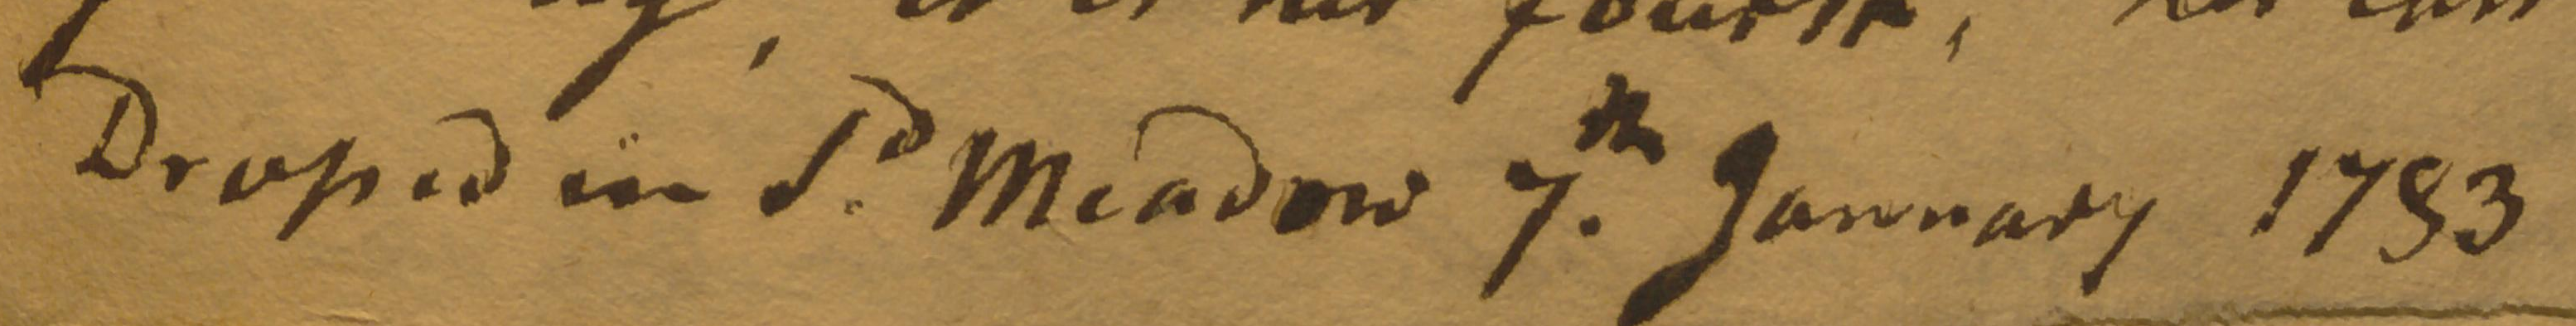Droped in S^d. Meadow 7^th. Jannary 1783
